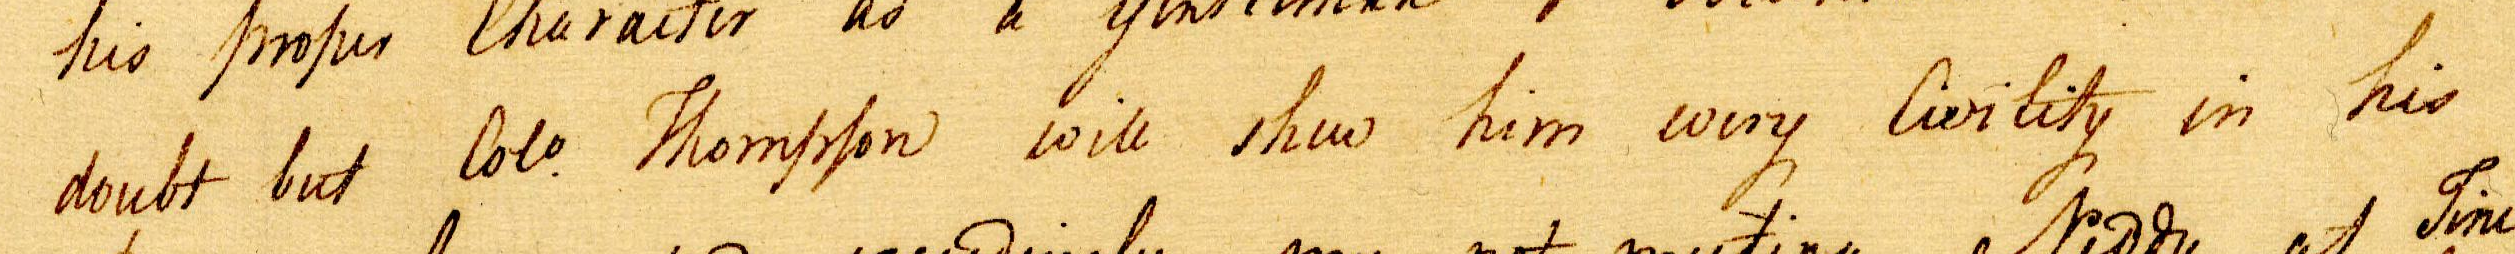doubt but Col^o Thompson will shew him every Civility in his
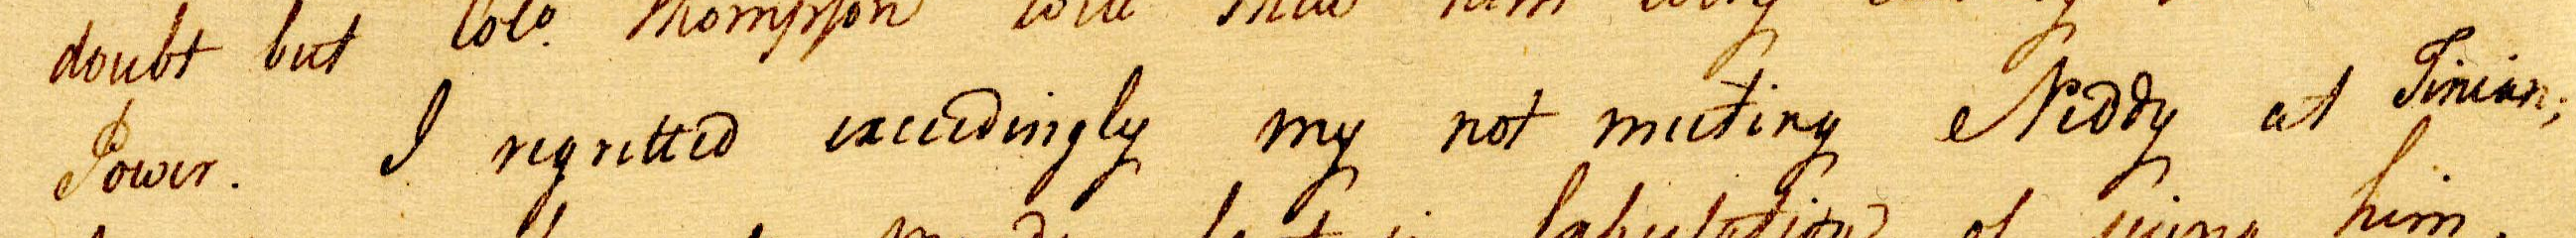Power. I regretted exceedingly my not meeting Neddy at Tinian;
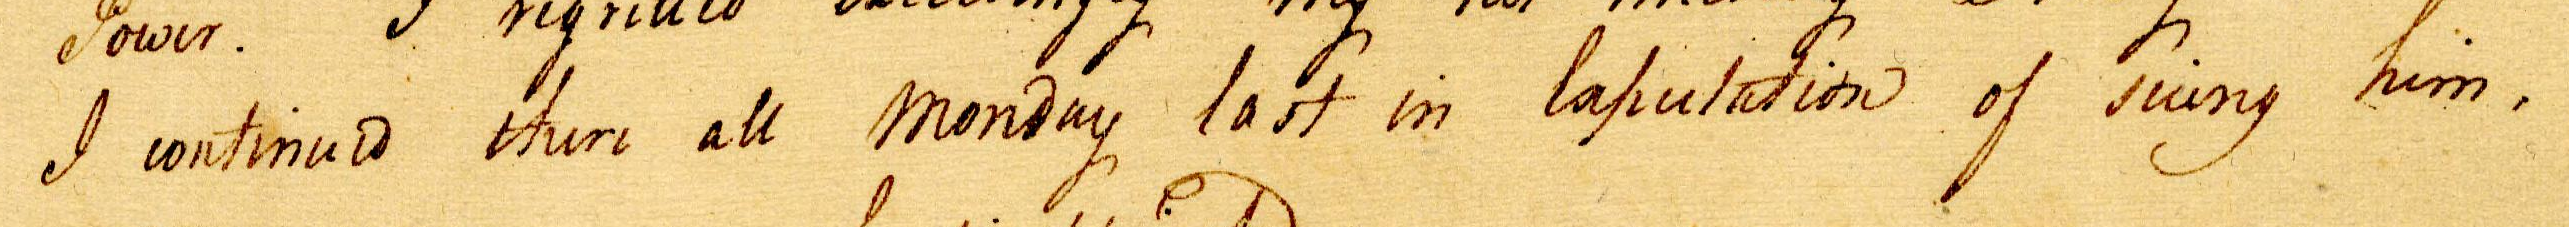I continued there all Monday last in Expectation of seeing him,
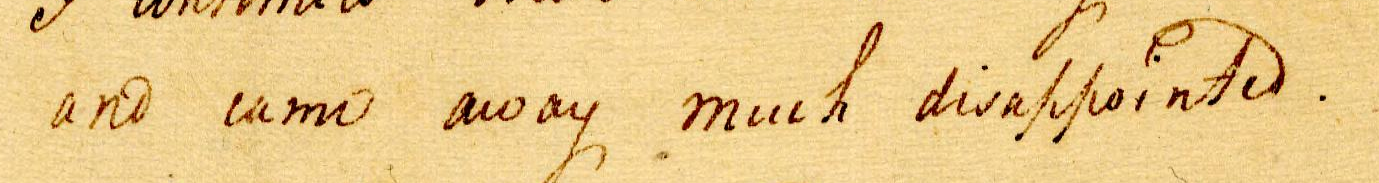and came away much disappointed.
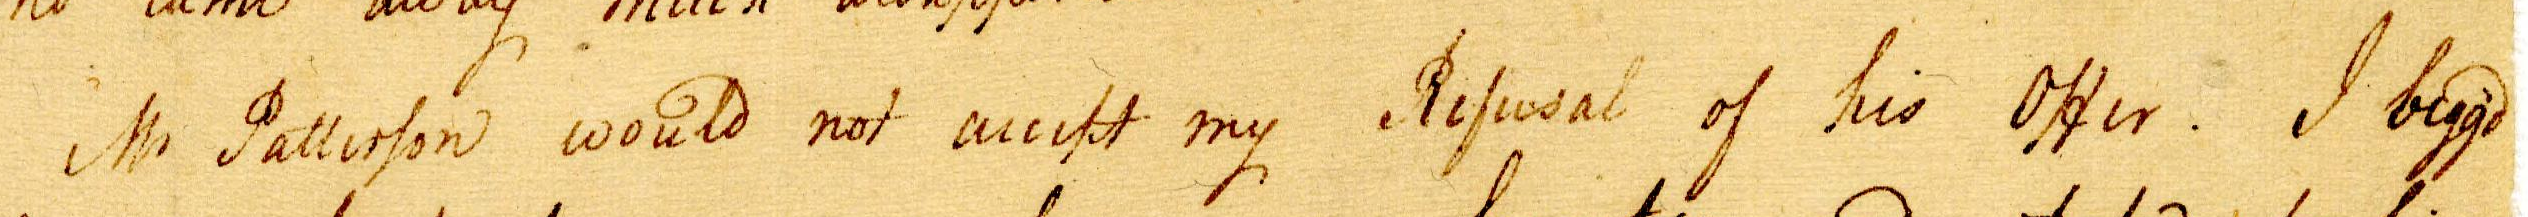Ms Patterson would not accept my Refusal of his Offer. I begg'd
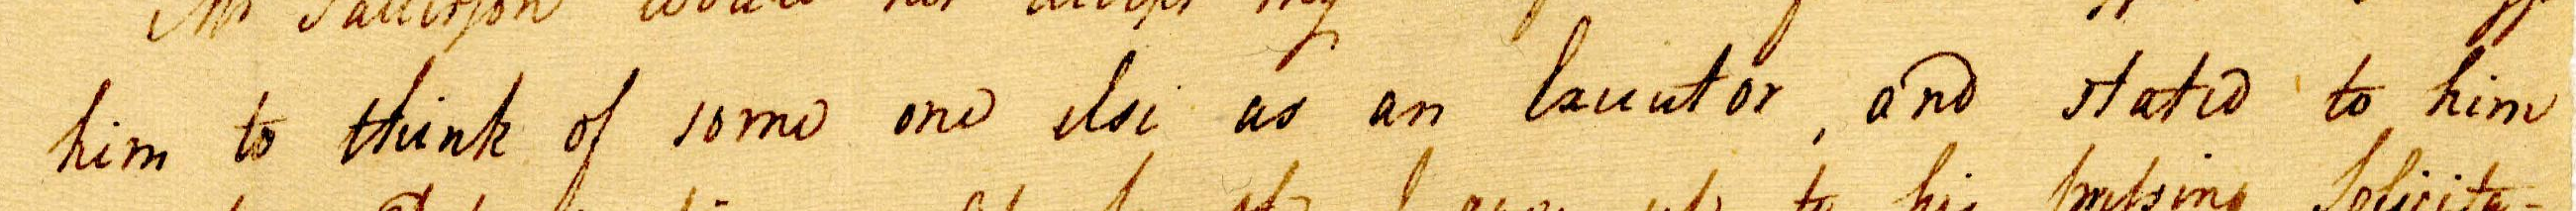him to think of some one else as an Executor, and stated to him
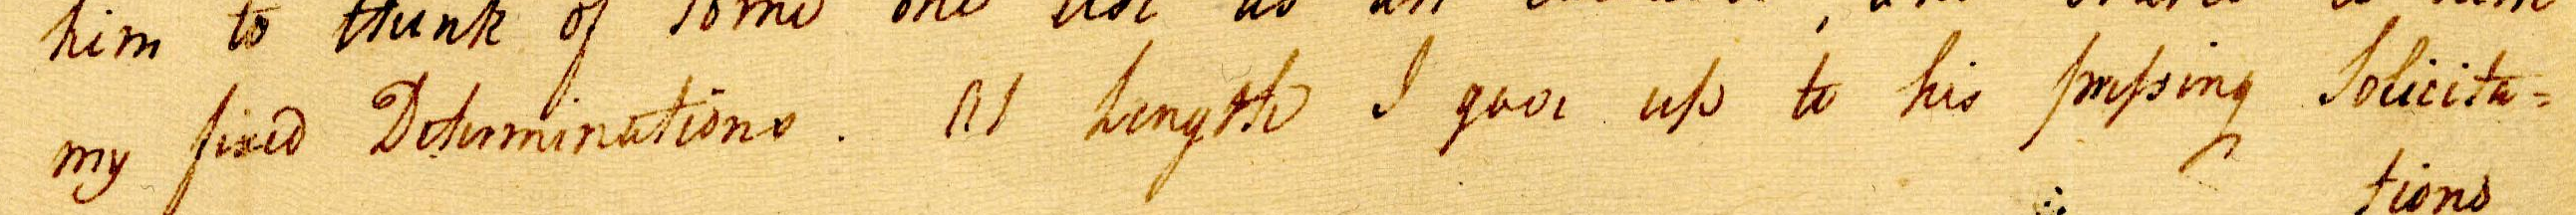my fixed Determinations. At Length I gave up to his pressing Solicita-
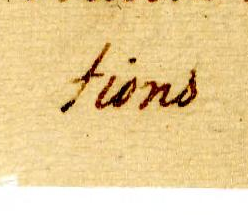-tions
